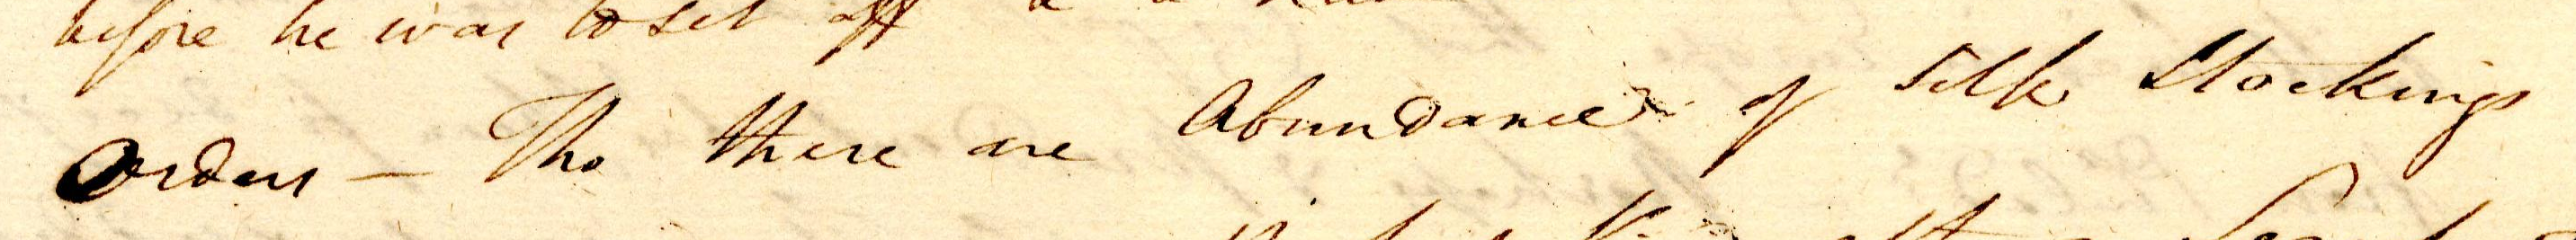Orders. Tho there are Abundance of silk Stockings
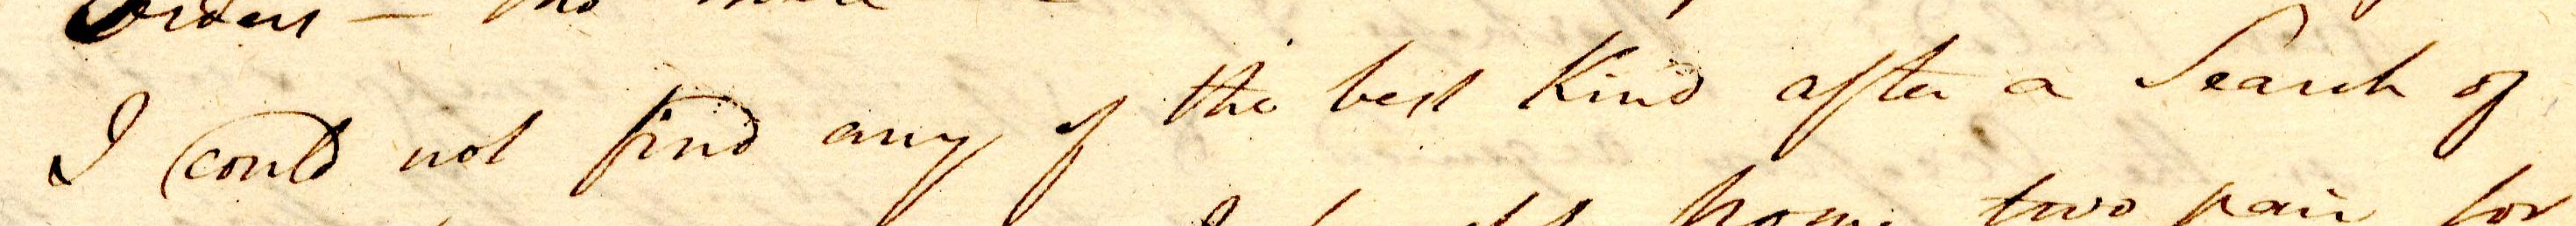I could not find any of the best kind after a Search of
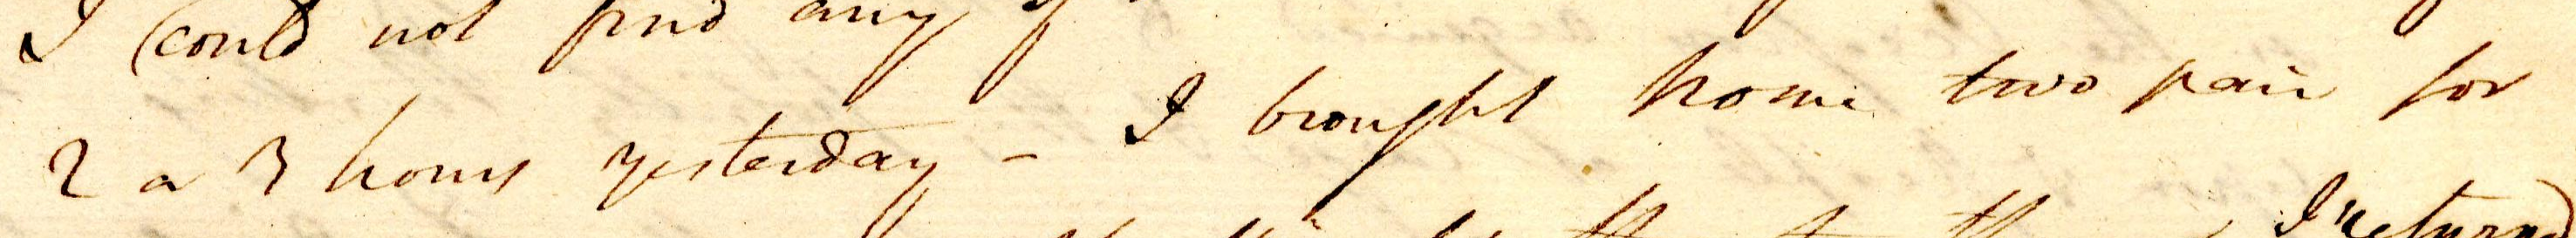2 or 3 hours yesterday. I brought home two pair for
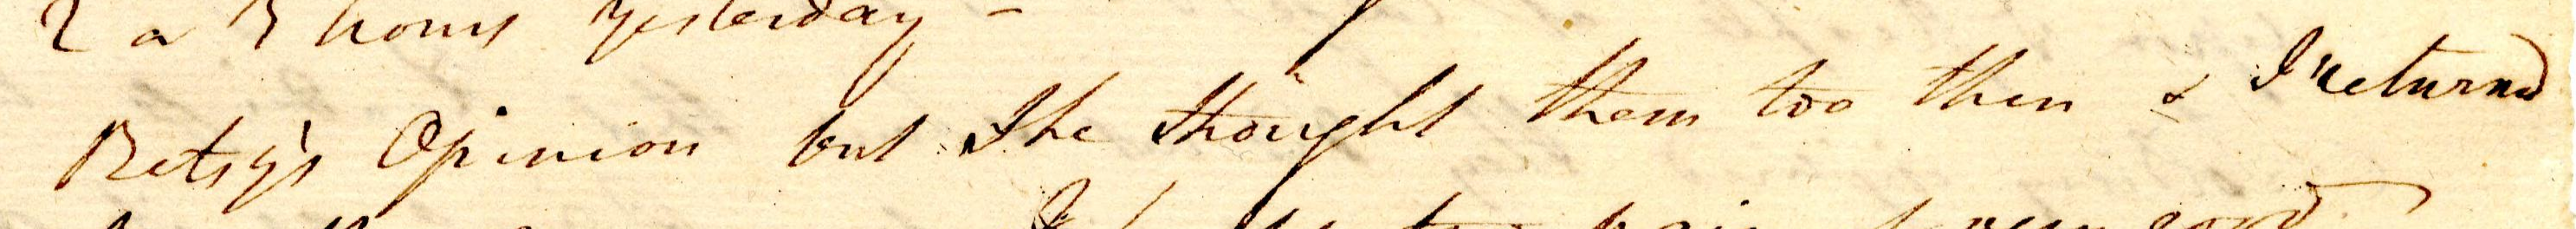Betsy's Opinion but She thought them too then & I returned
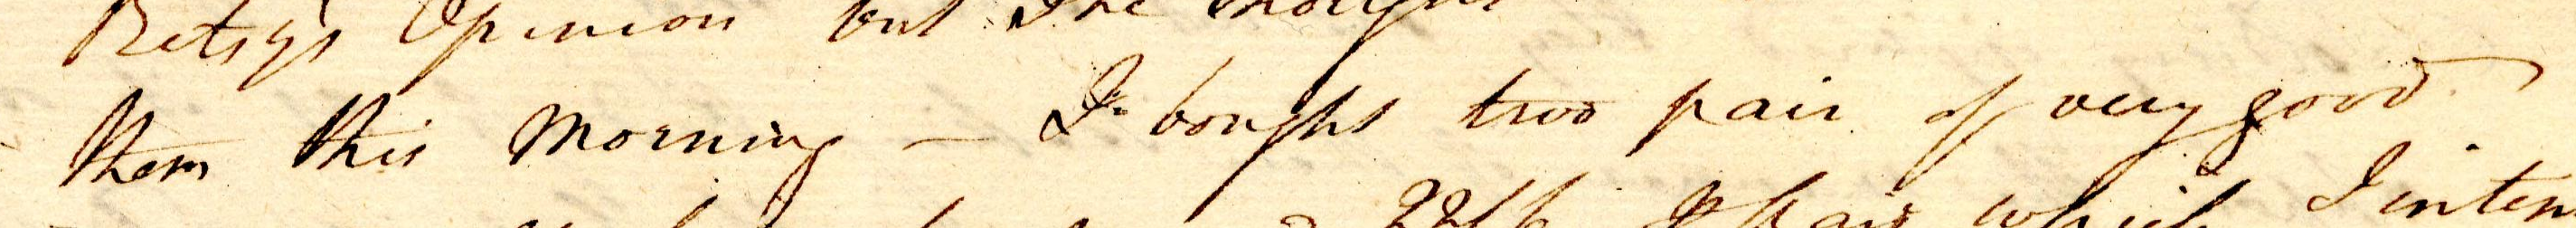them this morning. I bought two pair of very good
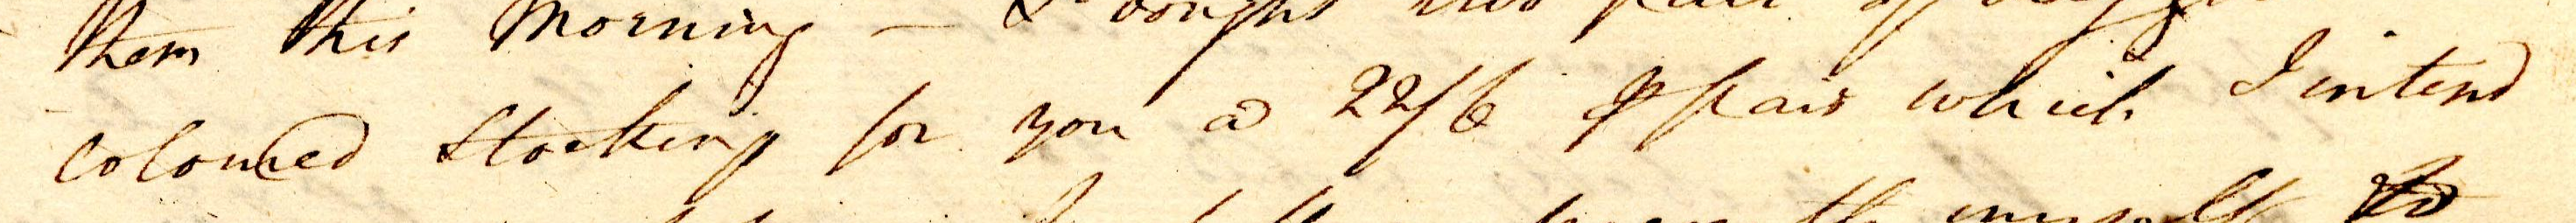coloured Stocking for you @ 22s6 per pair which I intend
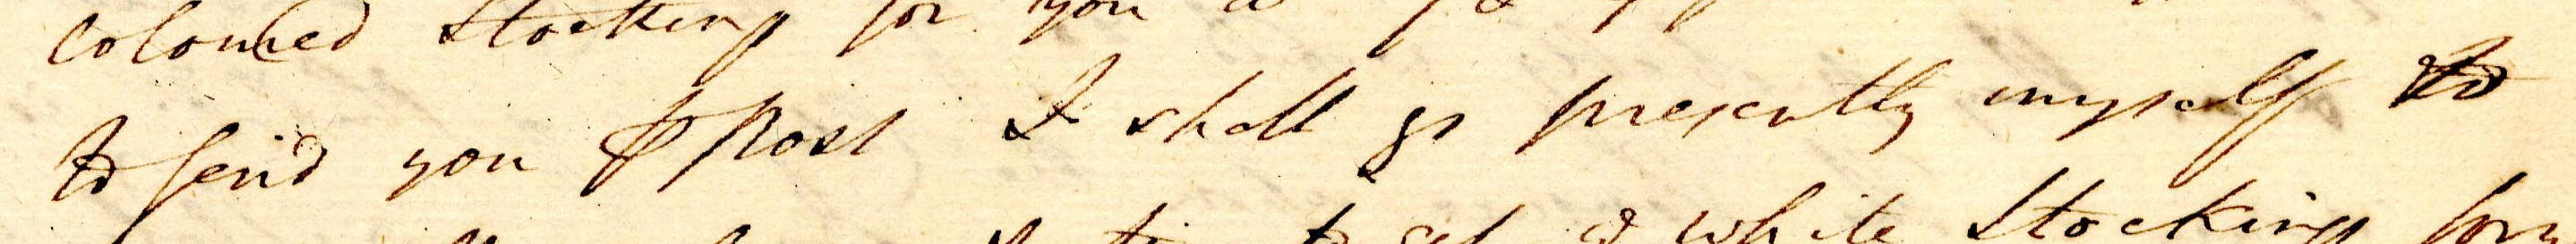to send you per Post I shall go presently myself to
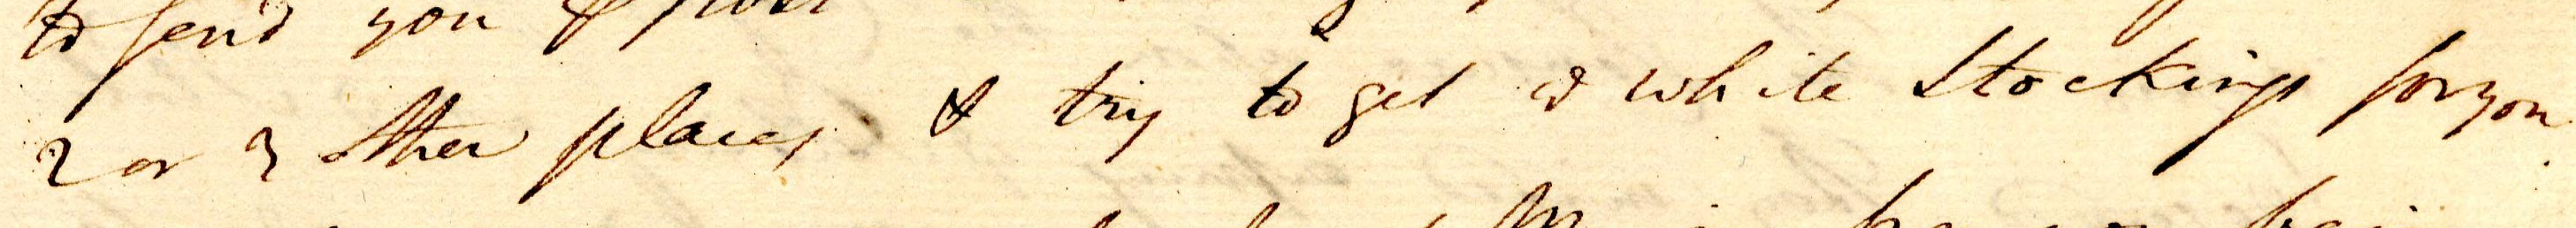2 or 3 other places & try to get y^e white Stockings for you.
